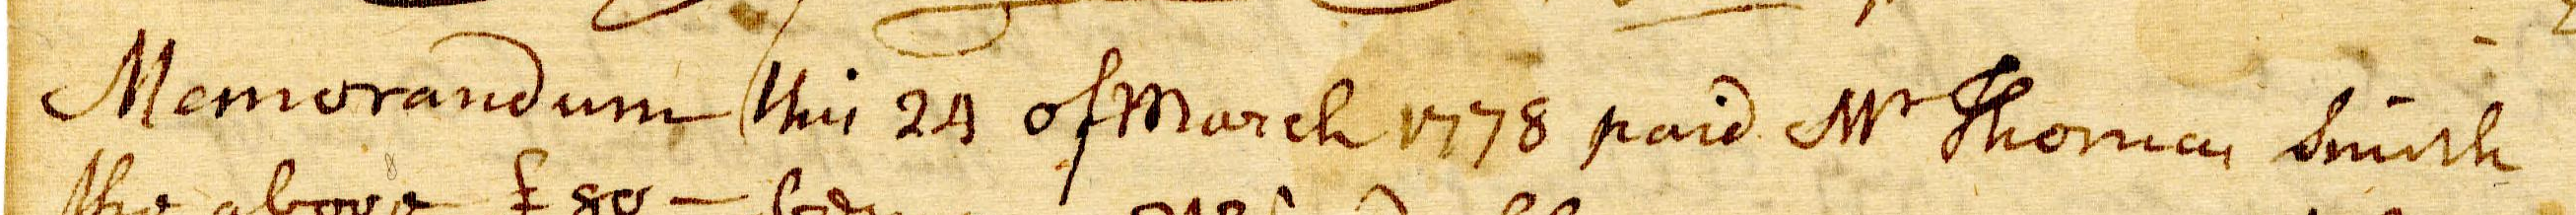Memorandum this 2 of March 1778 paid M^r Thomas Smith
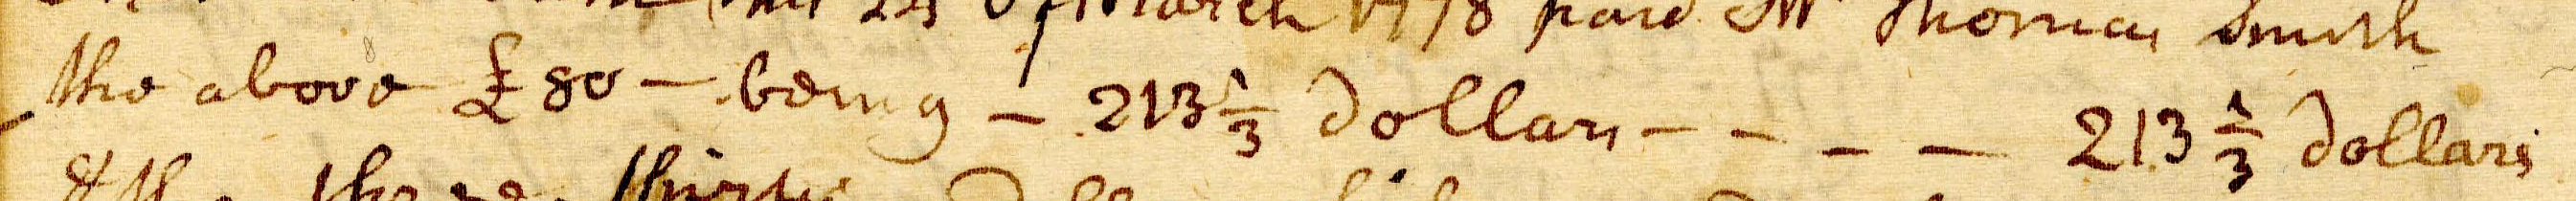the above £80- being- 213 1/3 dollars---- 213 1/3 dollars
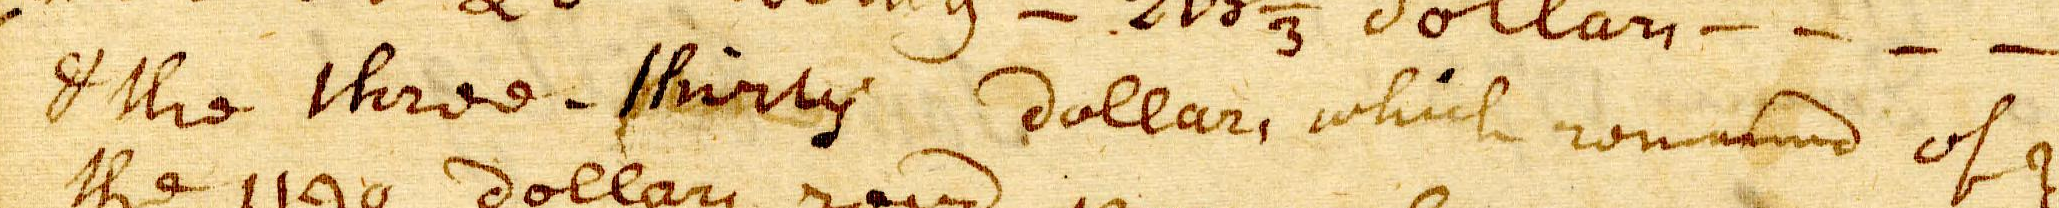& the three-thirty dollars, which received of
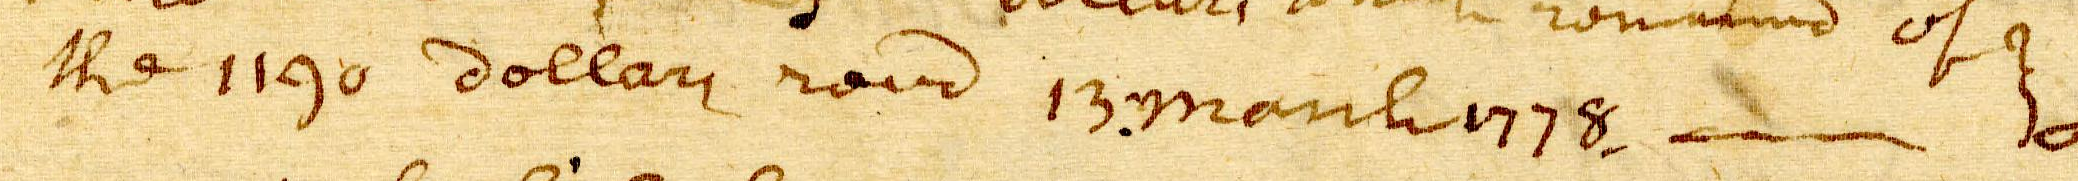the 1190 dollars recd 13 March 1778. ---
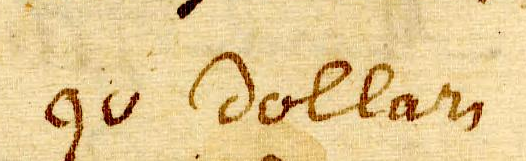90 dollars
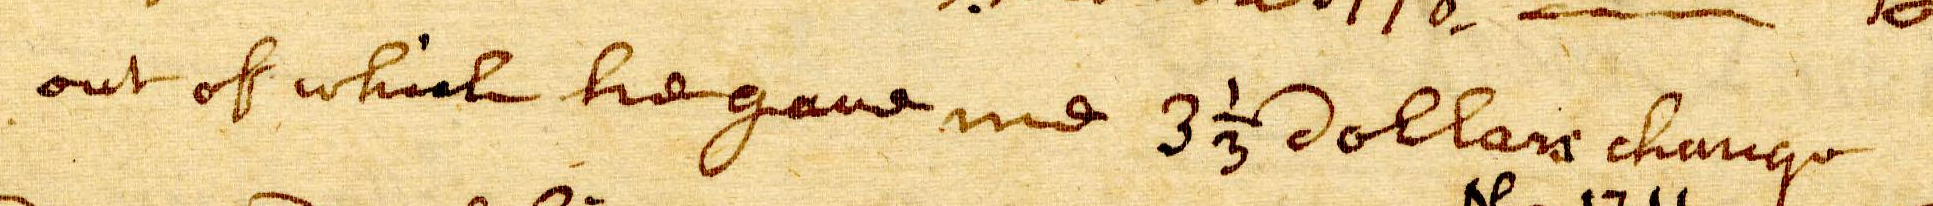out of which he gave me 3 1/3 dollars change
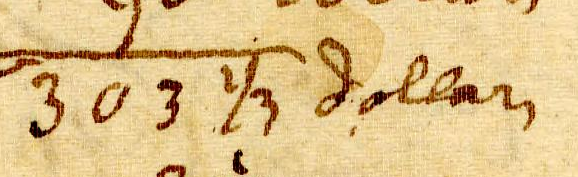303 1/3 dollars
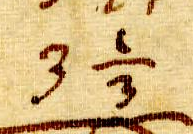3 1/3
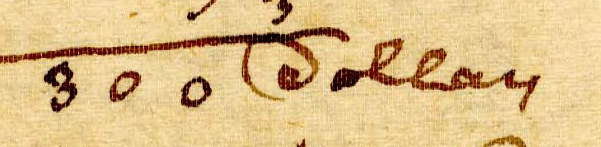30 0 dollars
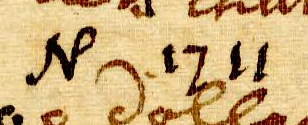N 1711
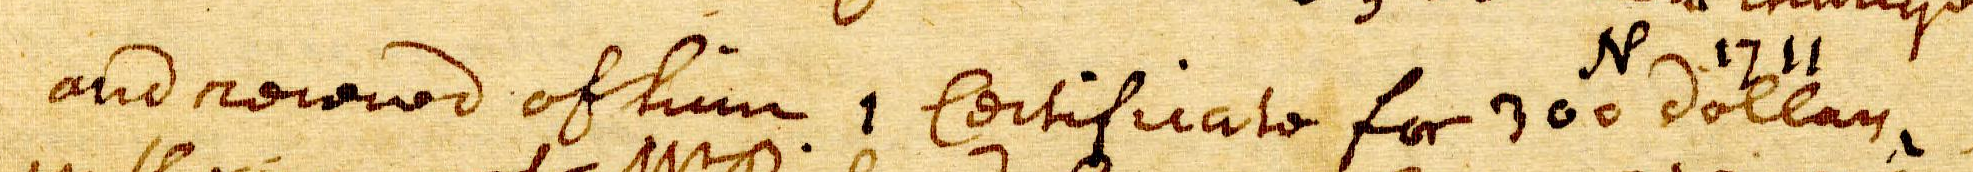and received of him, 1 Certificate for 300 dollars.
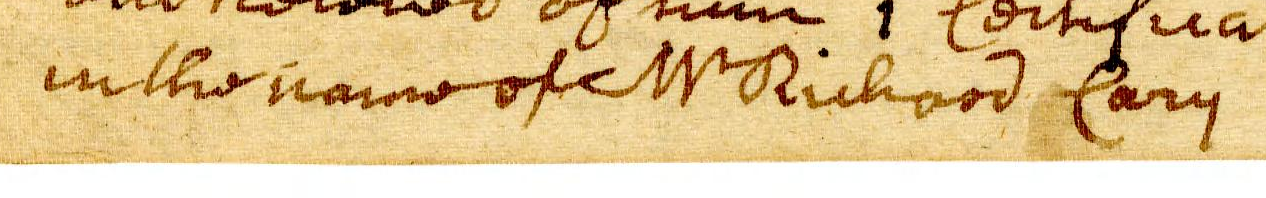in the name of M^r Richard Cary
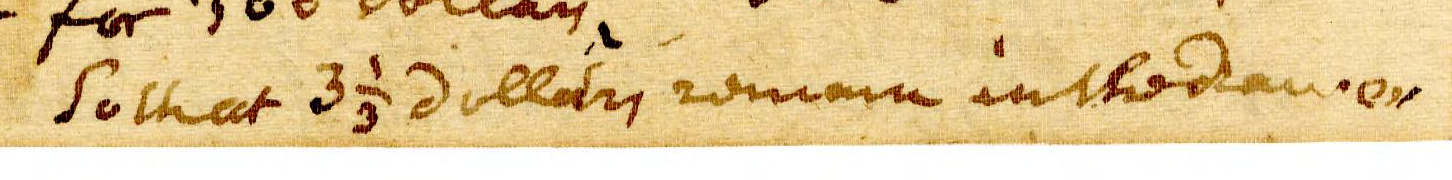So that 3 1/3 dollars remain in the drawer
